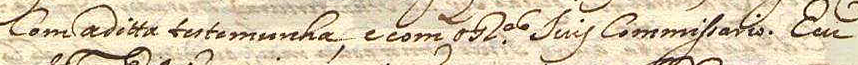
Com a ditta testemunha, e com o R.do Iuis Commissario. E eu
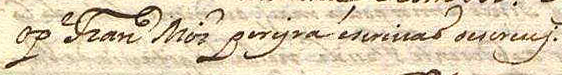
o p.e Franco Miz̄ perejra escriuaõ o escreuj.
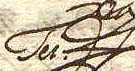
Tei.ra
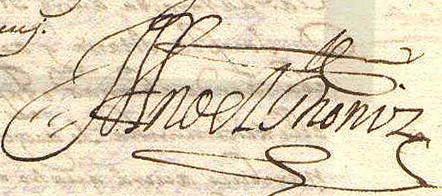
Mnoel Moniz
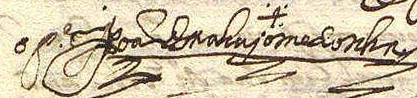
o p.e Joaõ darahujo medonha
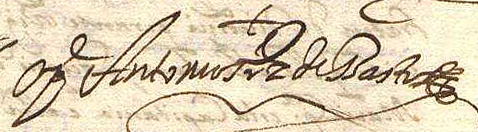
o pe Antonio Frz̄ de Bastos
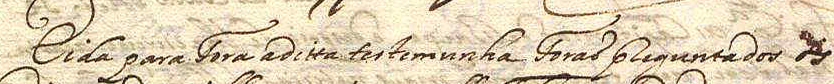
E ida para Fora a ditta testemunha Foraõ preguntados os
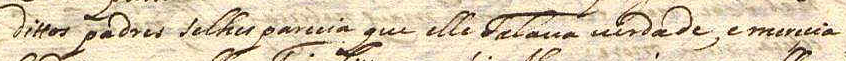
dittos padres se lhes parecia que elle Falaua uerdade, e merecia
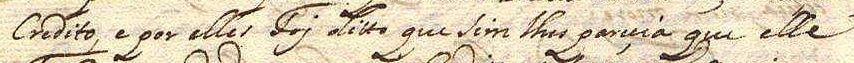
Credito, e por elles Foj ditto que sim lhes parecia que elle
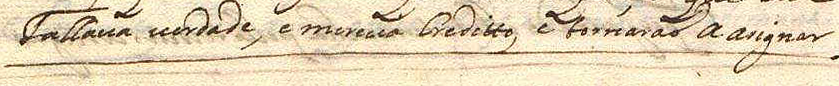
Fallaua uerdade, e merecia Creditto, e tornaraõ a asignar
